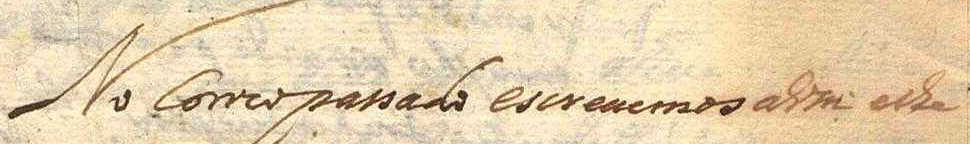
No correo passado escreuemos a V m e lhe
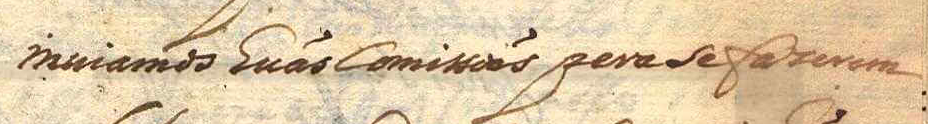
inuiamos huās comissoẽs pera se fazerem
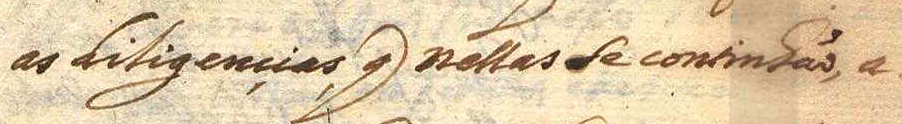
as diligencias, q̄ nellas se continhaõ, a
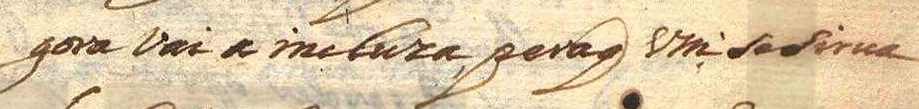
gora vai a incluza, pera q̄ v m se sirua
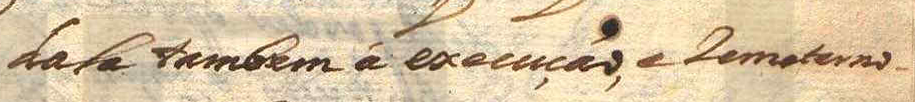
dala tambem á execuçaõ, e Remeter no
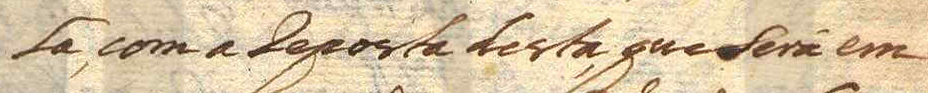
la, com a Reposta desta, que será em
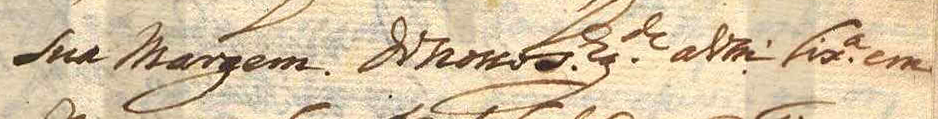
sua margem. Ds̄ nosso s.or g.de a v m lix.a em
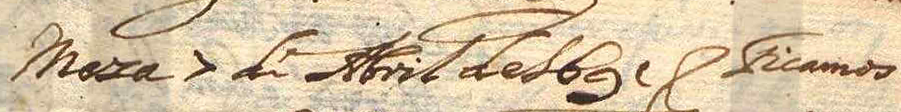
Meza 7 de Abril de 1691. Ficamos
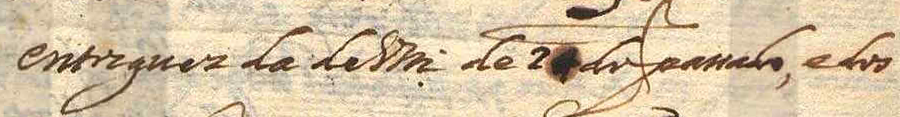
entreguez da de V m de 24 do passado, e dos
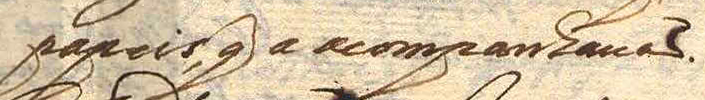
papeis, q̄ a acompanhauaõ.
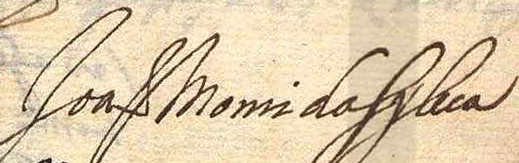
Joaõ Monis da Sylua
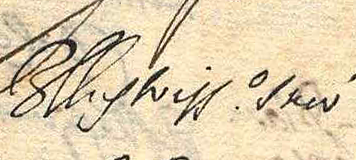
Illustriss.o snor̄
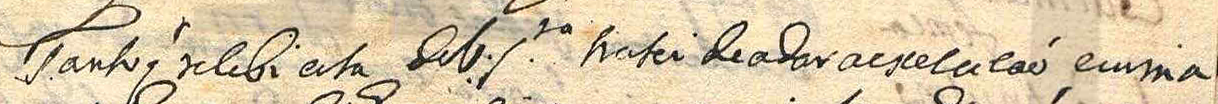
Tanto q̄ recebi esta de V. s.ra tratei de a dar a execuçaõ e uim a
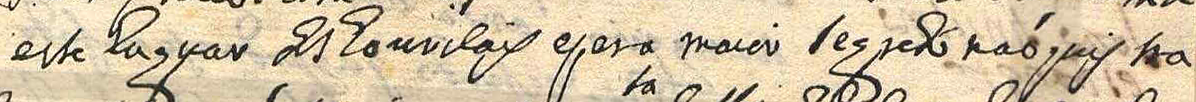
este luguar dos louriçais e pera maior segredo naõ quis tra
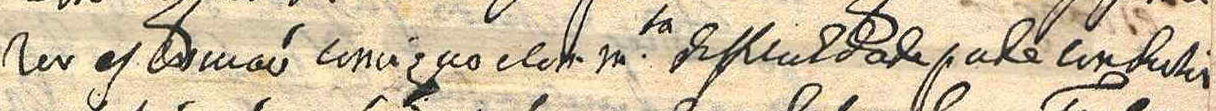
zer escriuaõ comiguo e com m.ta difficuldade pude conduzir
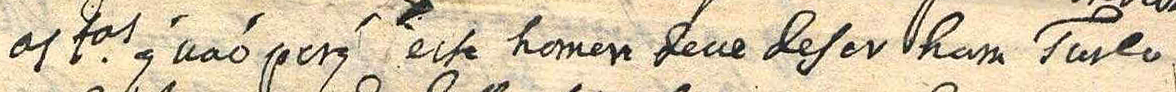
as t.as q̄ uaõ porq̄ este homem deue de ser hum Turco
